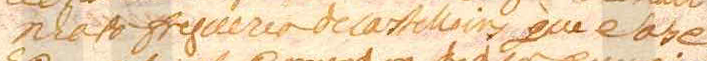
nhato freguezia de castelloins que Sabe
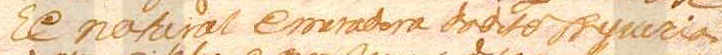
he natural e moradora da dita freguezia
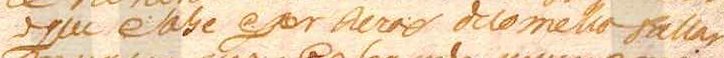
o que sabe por Rezaõ de com ella fallar
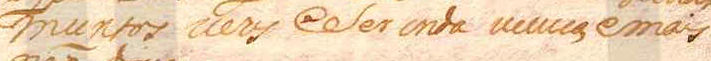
muntas uezes e Ser inda ueuua, e mais
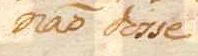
naõ disse
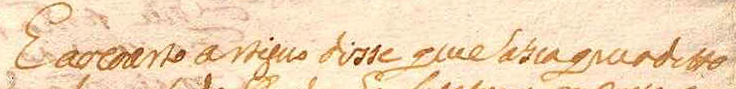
E ao coarto artiguo disse que Sabia que o ditto
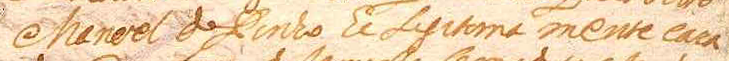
Manoel do Pinho he Legitimamente caza
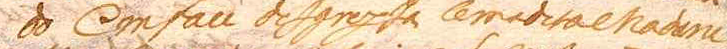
do em face de JgreyJa com a dita Madane
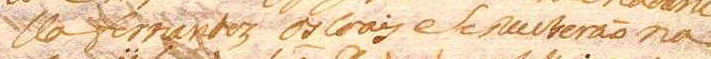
lla fernandez os coais se Receberaõ na
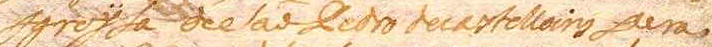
JgreyJa de Saõ Pedro de castelloins pera
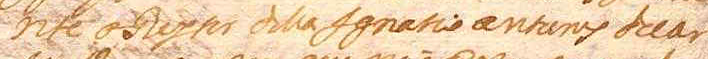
nte o Reytor della Jgnasio antunes de car
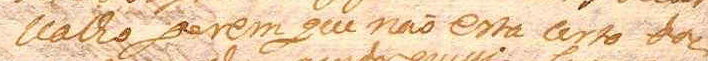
ualho porem que naõ esta certo das
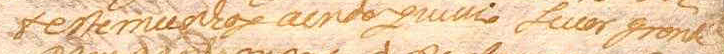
testemunhas ainda que uio Leuar grande
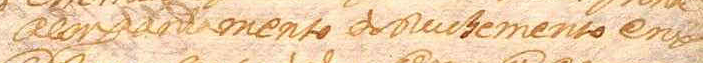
acompanhamento do Recebimento e nao
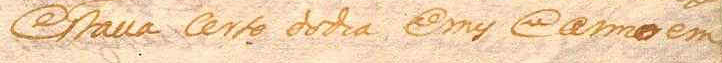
Estaua certo do dia E mes E anno em
